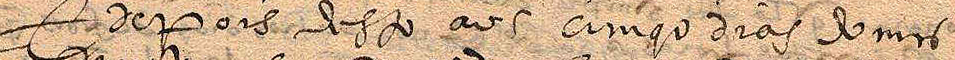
E depois desto aos çimqo dias do mes
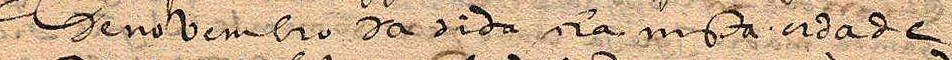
de novembro da dita era nesta cidade
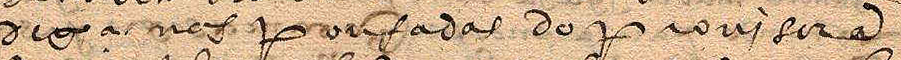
de goa nas pousadas do proujsor ā
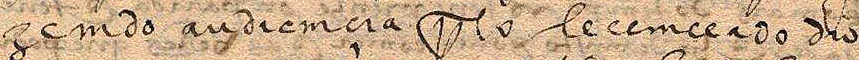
zemdo audiençia p̄lo lecemceado dio
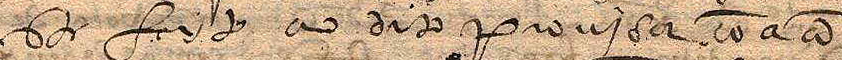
este feyto ao dito proujsor c̄o a c̄o
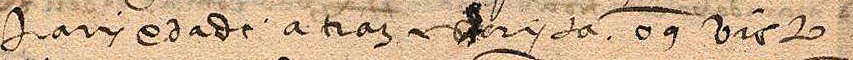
traryedade atraz escryta o q̄ visto
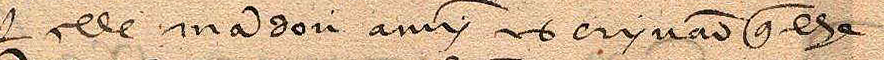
ꝑ elle mādou a mȳ escryuão q̄ lhe
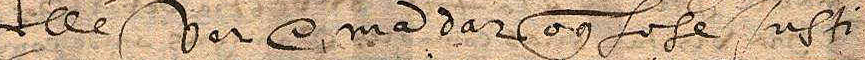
elle ver e mādar o q̄ fose Justi
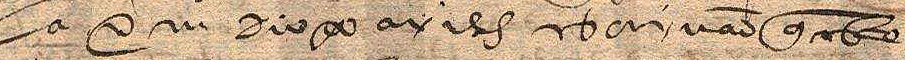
Ça e eu diogo ayres escryuão q̄ esto
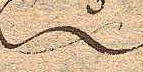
Cro
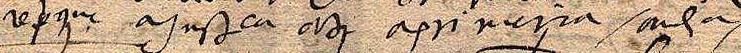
repique a Justca ate a primeira / auda /
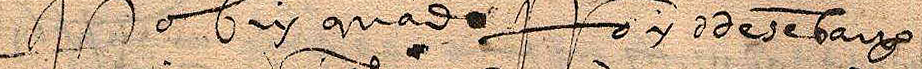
Pobryquado ffoy o des̄ebargo
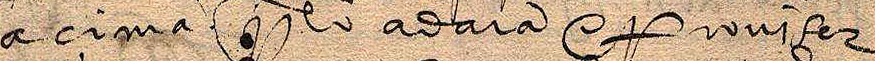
açima p̄lo adaiā e proujsor
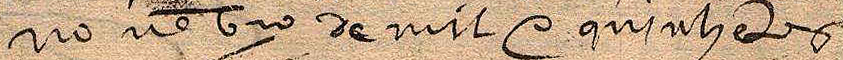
nouēbro de mil e qujnhētos
